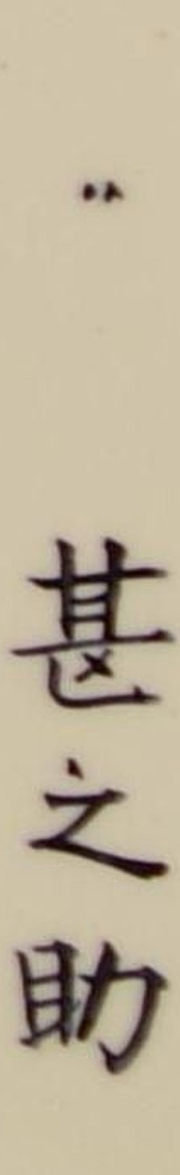甚之助
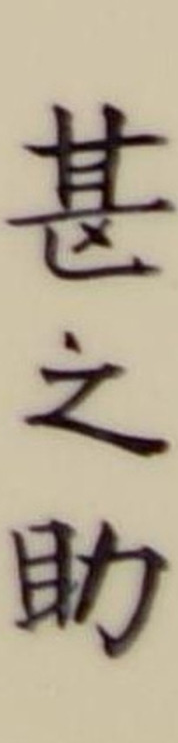甚之助
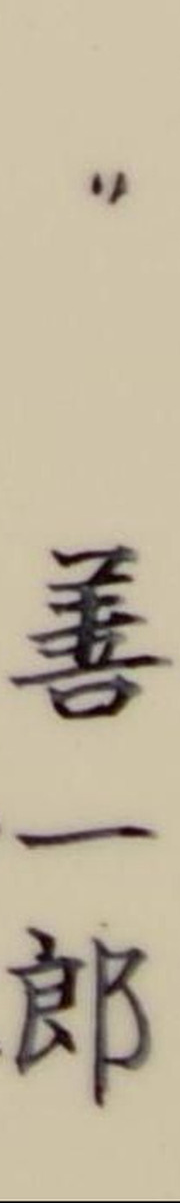善一郎
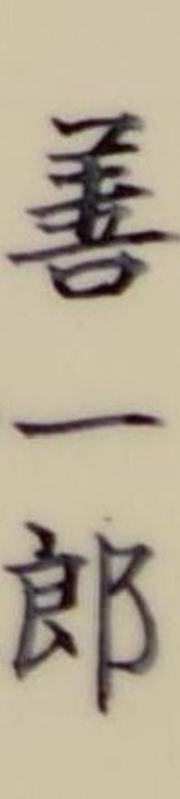善一郎
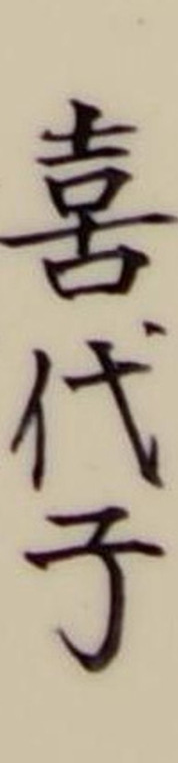喜代子
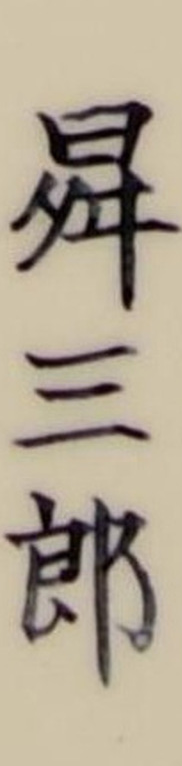昇三朗
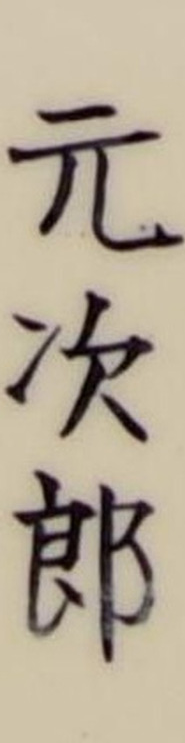元次郎
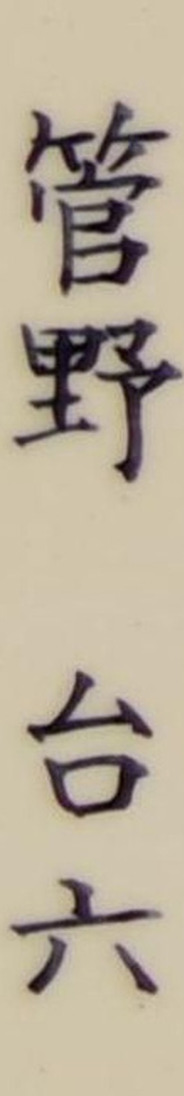管野台六
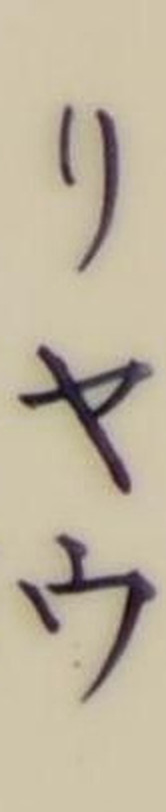リヤウ

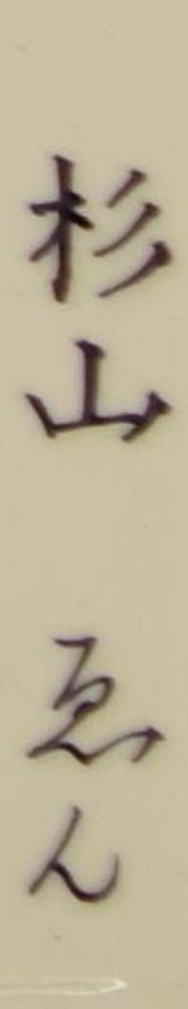杉山えん
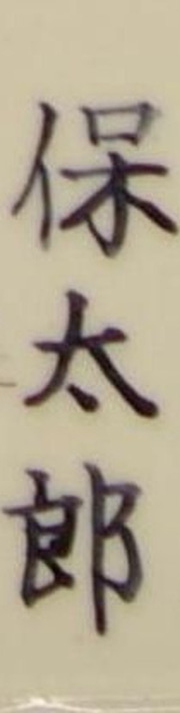保太郎
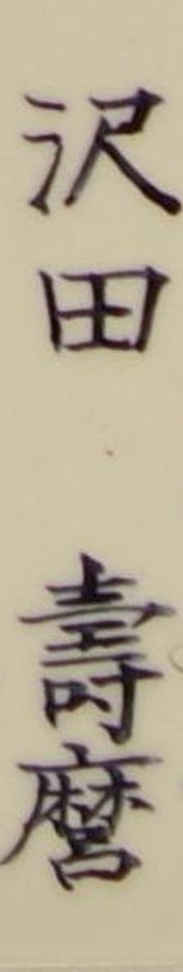沢田壽麿
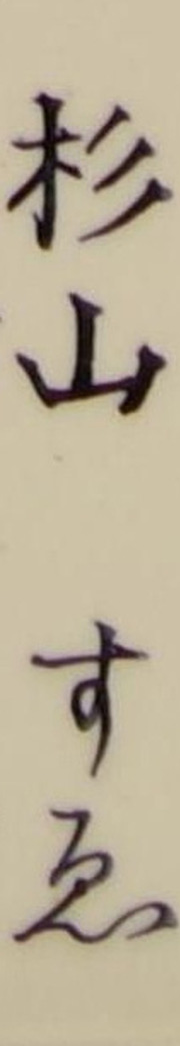杉山すえ
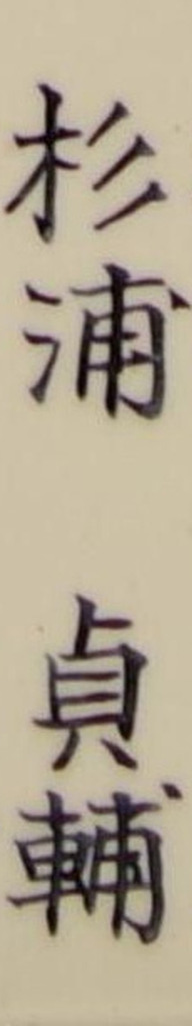杉浦貞輔
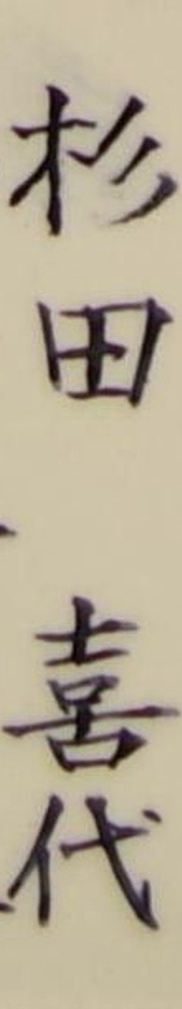杉田喜代
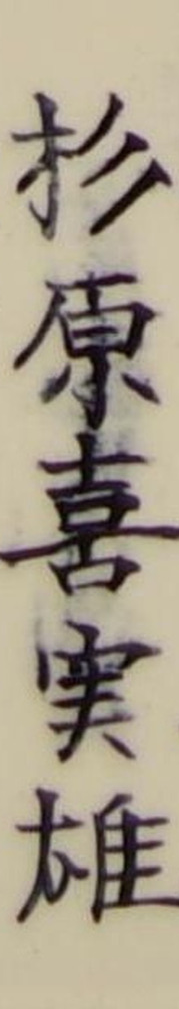杉原喜実雄
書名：E~L
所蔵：高野山金剛峯寺
